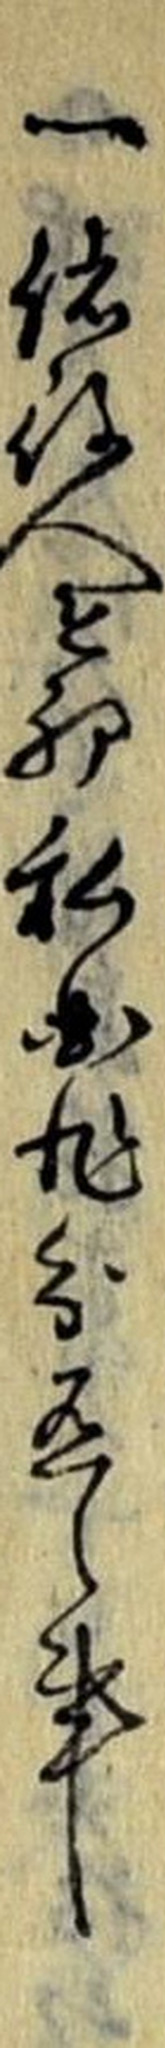一諸役人を初私曲非分有之事
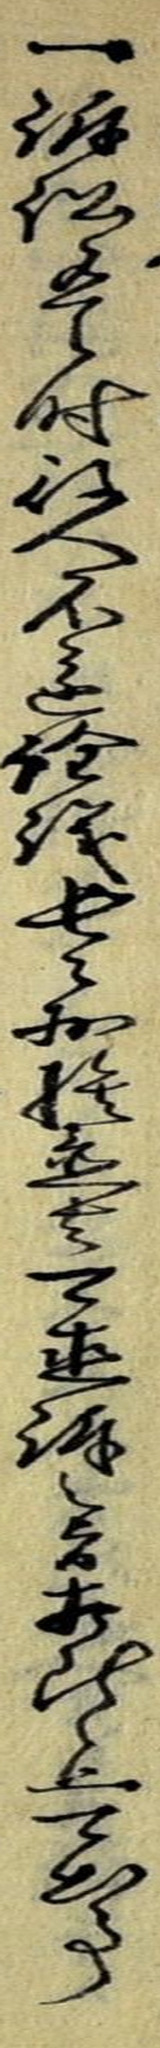一訴訟有之時役人不遂詮議長々於捨置者可直訴之旨相断之上可出事
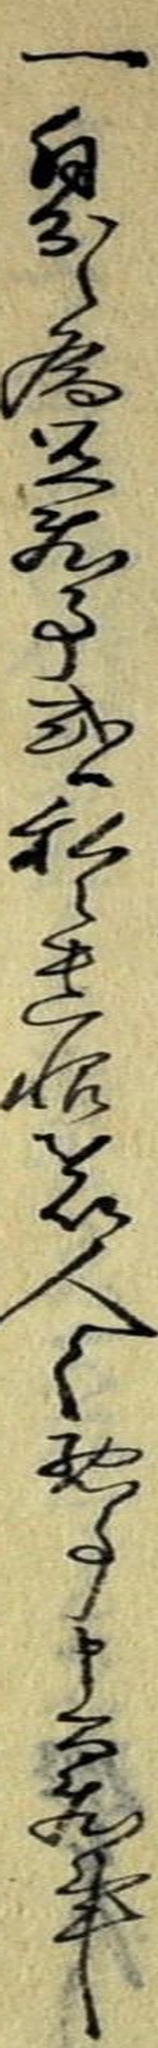一自分之為宜敷事或ハ私之遺恨を以人之悪事申間敷事
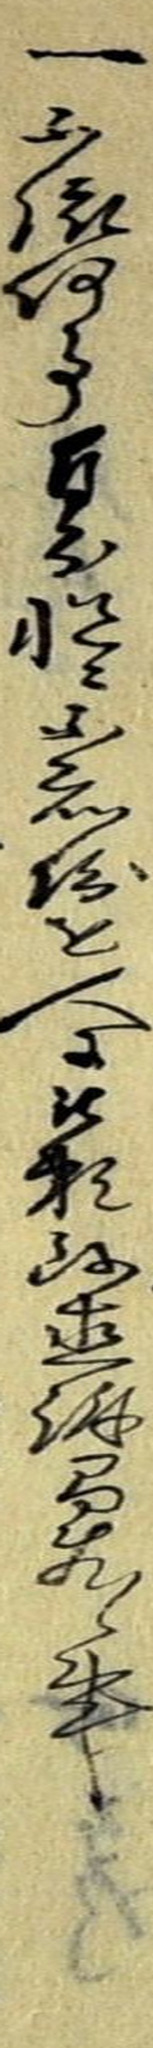一不依何事自分慥ニ不知儀を人に被頼致直訴間敷候事
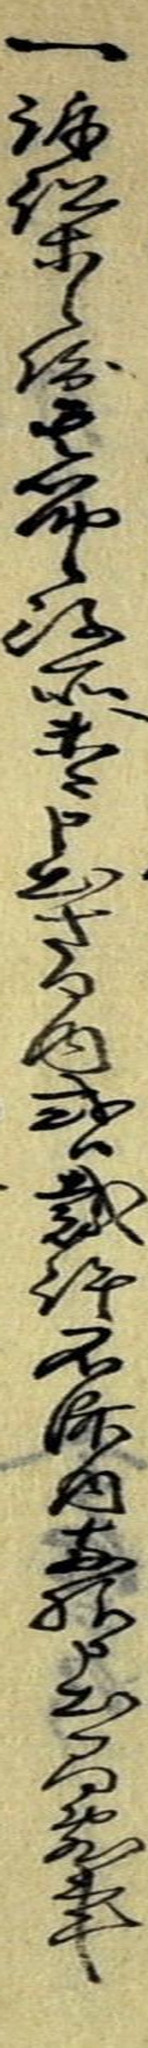一訴訟等之儀其筋之役所へ未た申出さる内或ハ裁許不済内両様申出間敷事
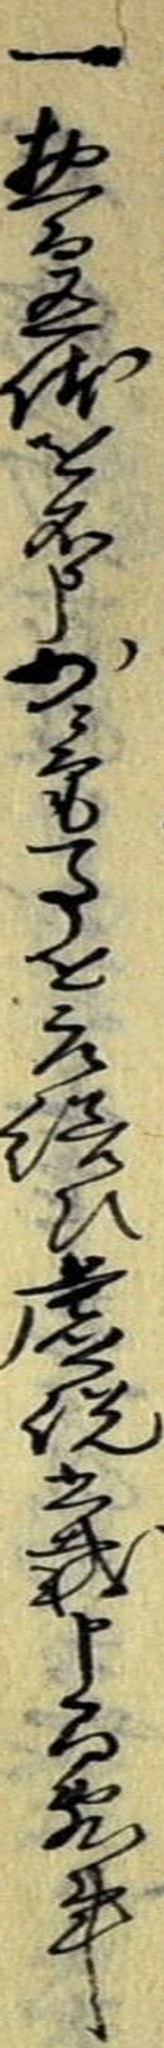一惣而有体を不申少ニ而も事を取繕ひ虚説書載申間敷事
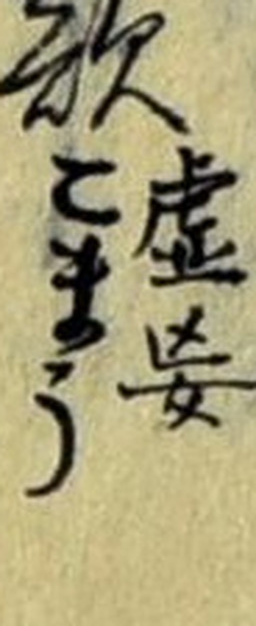こまう
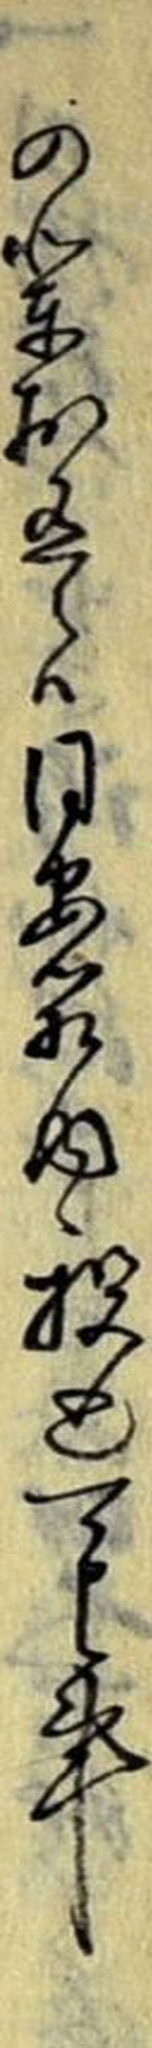の輩於有之ハ目安箱内へ投込可申事

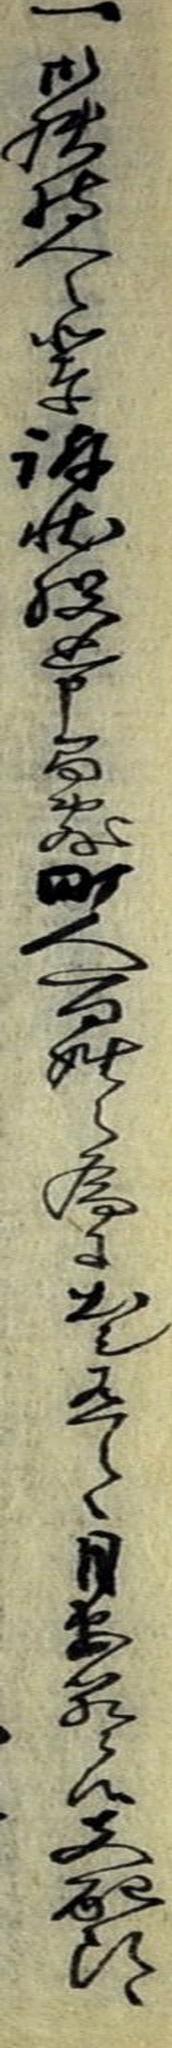一御扶持人之輩訴状投込申間敷町人百姓之為に出シ有之候目安箱ニ候支配頭へ
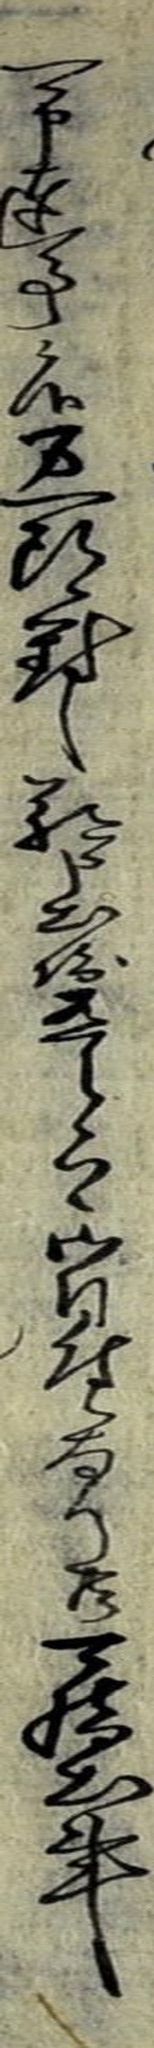可申達事ニ候万一頭へ対し難申出儀有之候ハヽ御目付へなり共可指出事
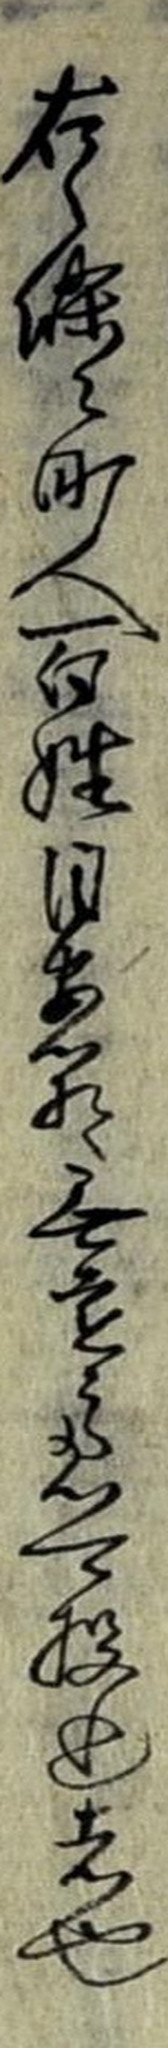右之条々町人百姓目安箱へ無遠慮可投込者也
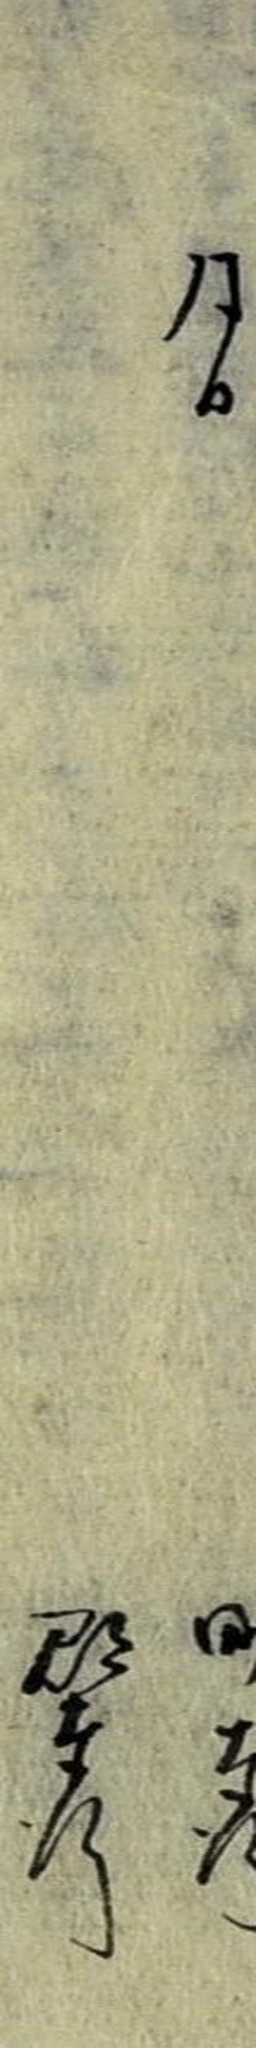郡奉行
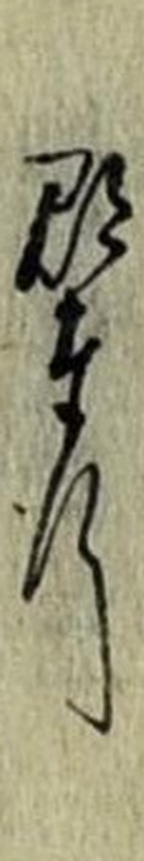郡奉行
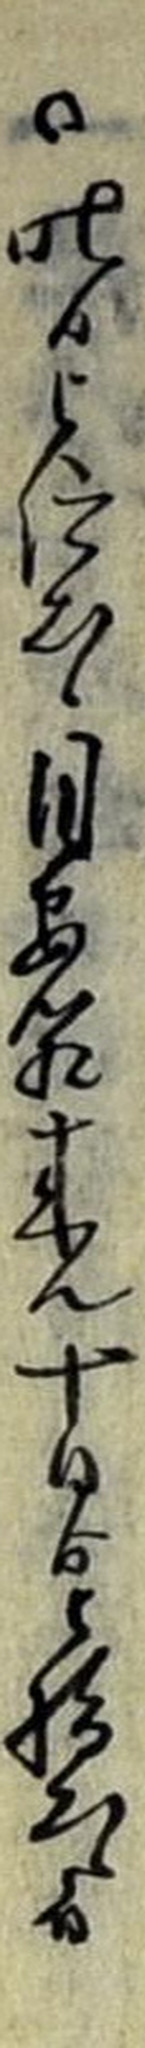〇昨日被仰出候目安箱来ル十日ゟ被指出候付金津奉行
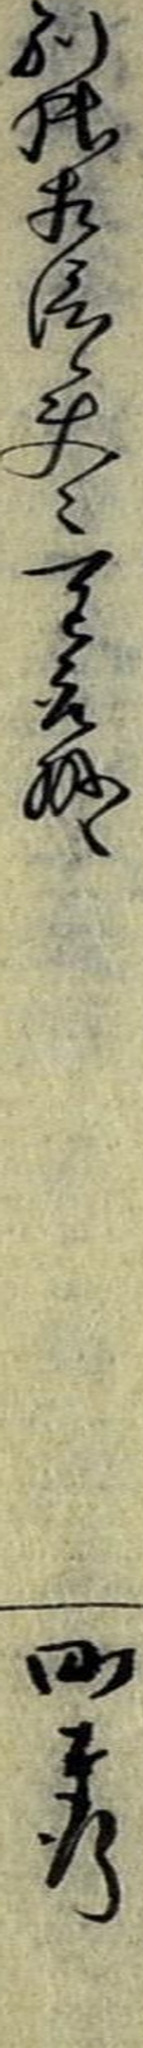別紙相渡候夫々可被取扱候町奉行
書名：命令之部 三
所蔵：福井県文書館 Fukui Prefectural Archives
